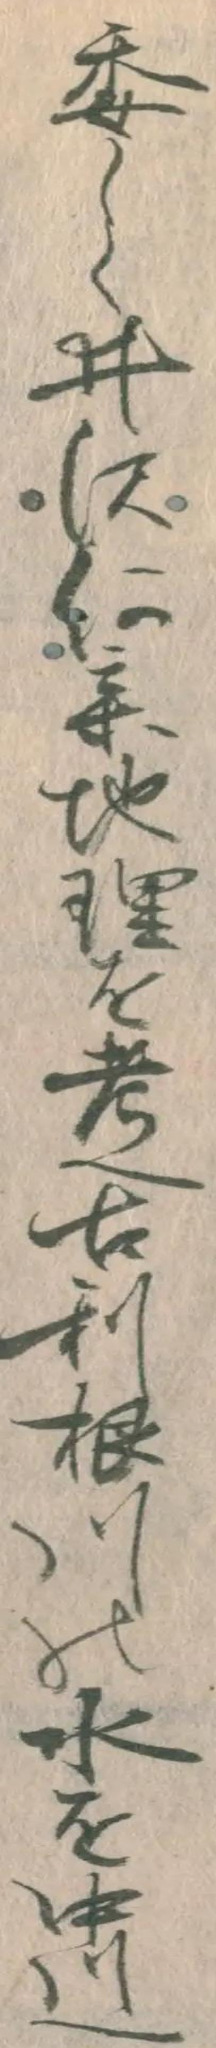委しく井沢何某地理を考へ古利根川の水を中川へ
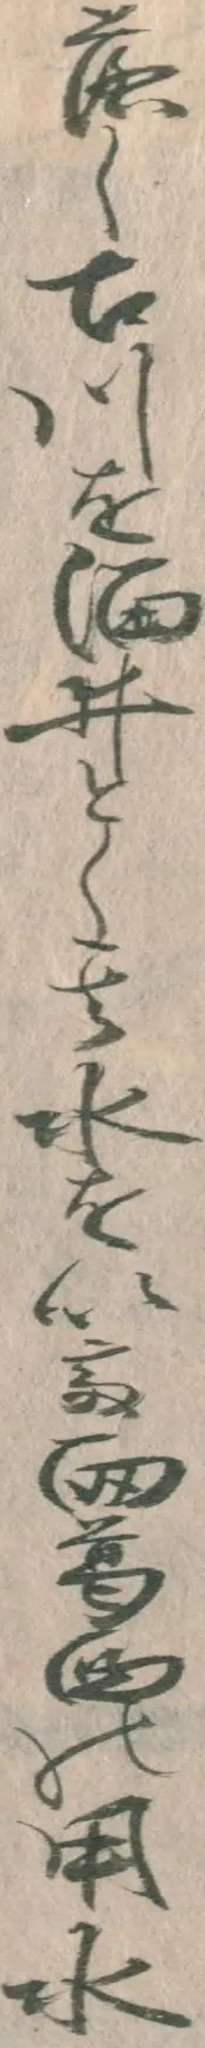落し古川を酒井とし其水を以て西葛西の用水
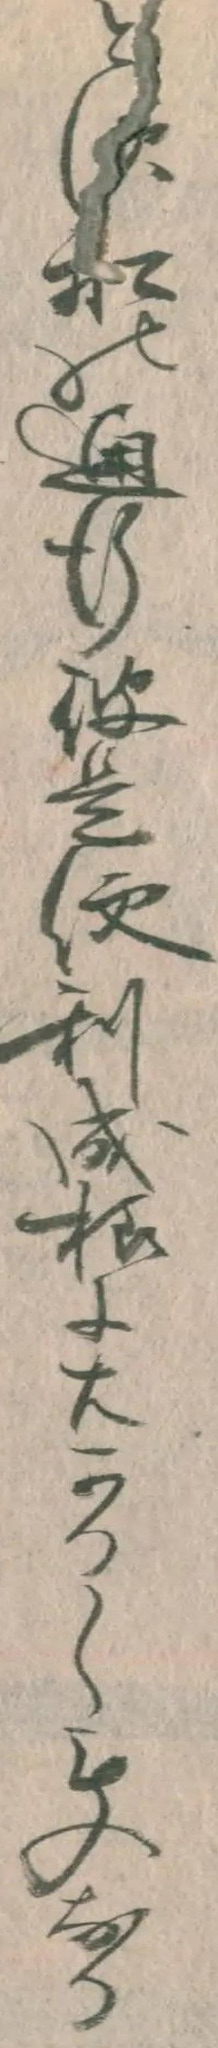とす船の通行彼是便利成様に共はかりしものなり
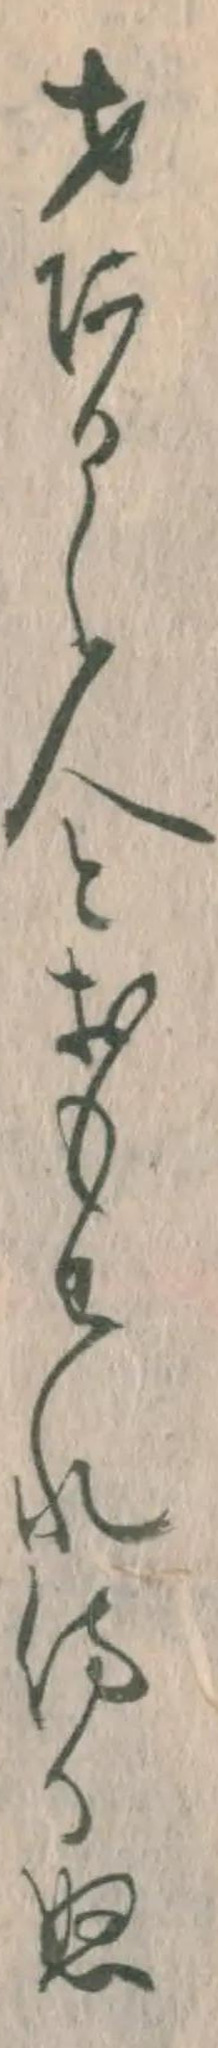才あるく人とおもわれ侍りぬ
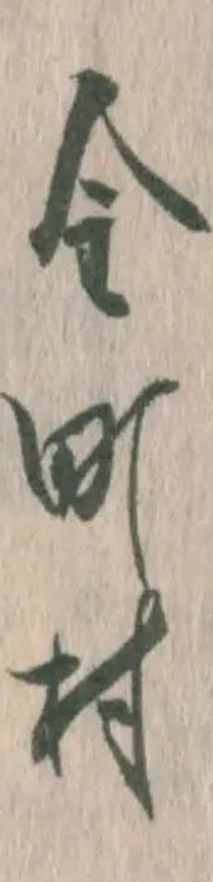金町村
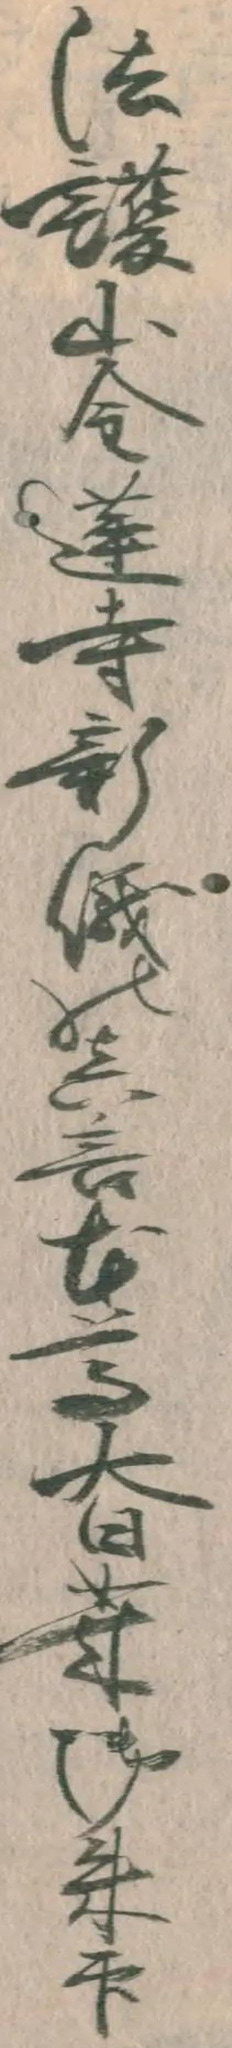法護山金蓮寺新儀の真言本尊火日如来御朱印
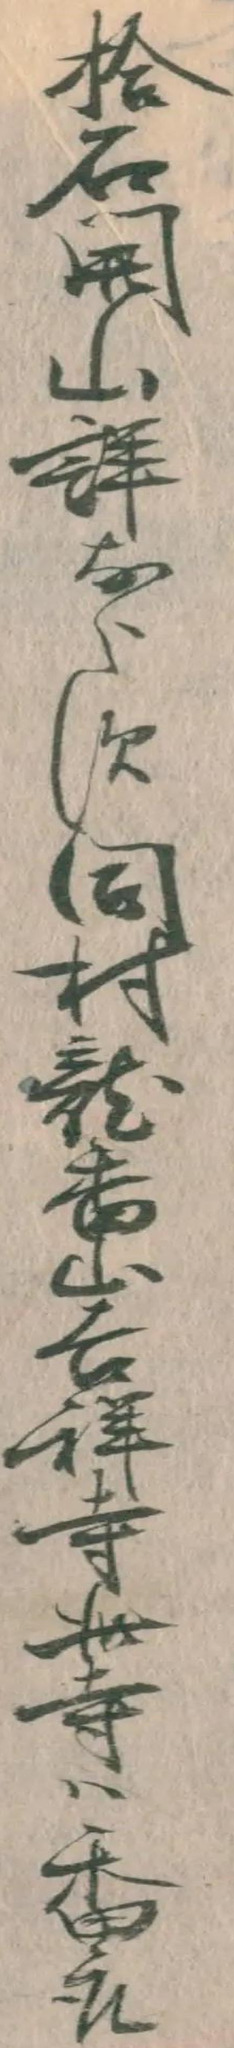拾石開山詳ならず同村龍香山吉祥寺此寺は香取
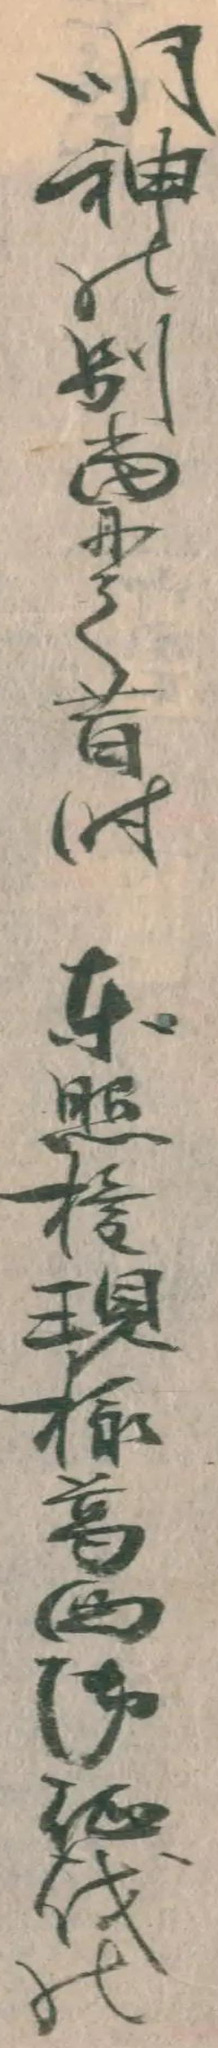明神の別当にて昔時東照権現様葛西御征伐の
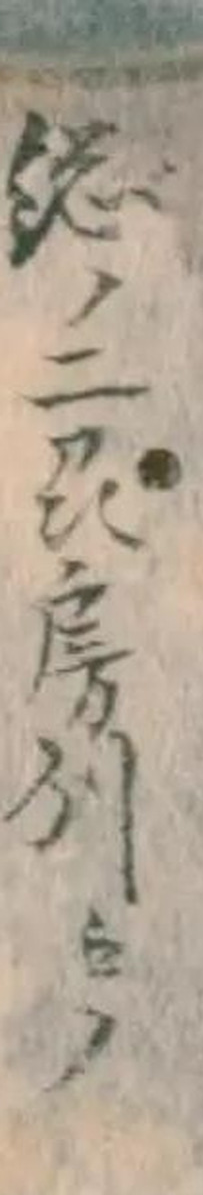総ノ二州房州えノ
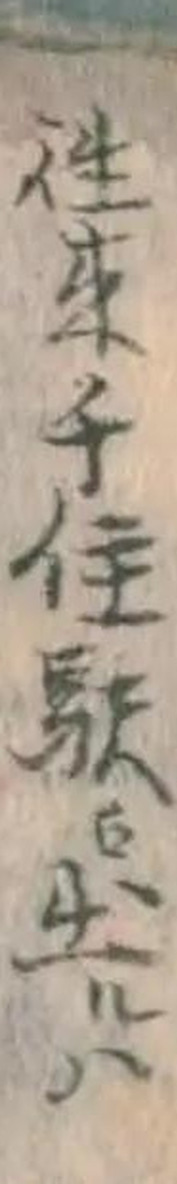往来千住駅え出ルハ
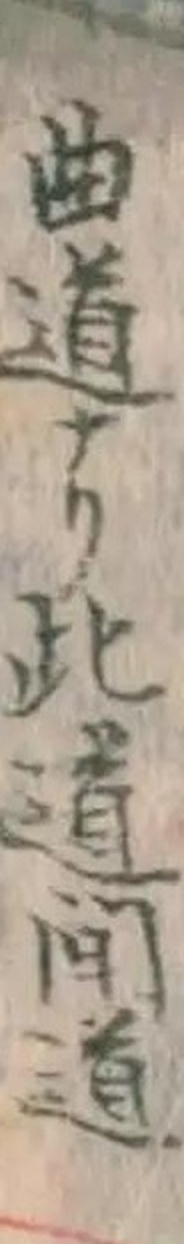曲道ナリ此道間道
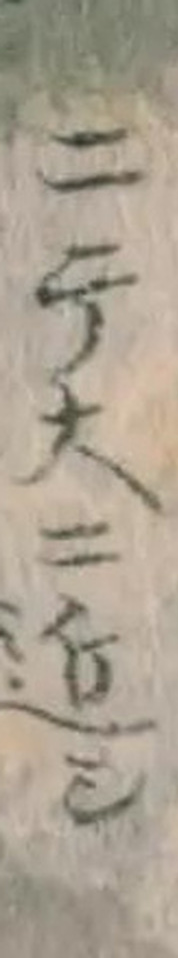二テ大ニ近シ
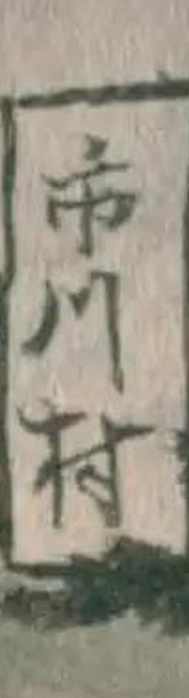市川村
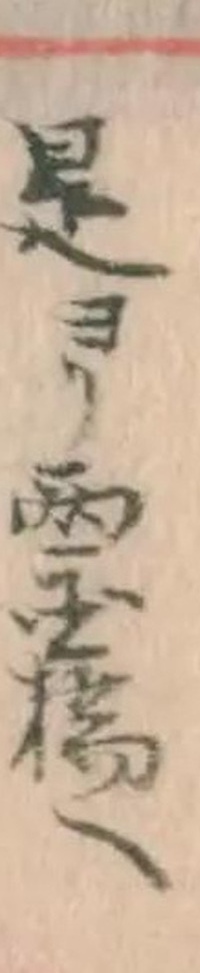是ヨリ西国橋へ
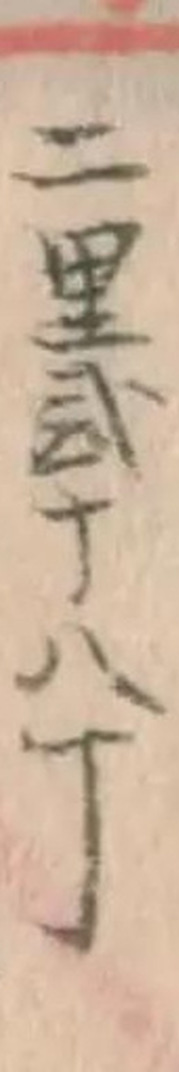二里弐十八丁
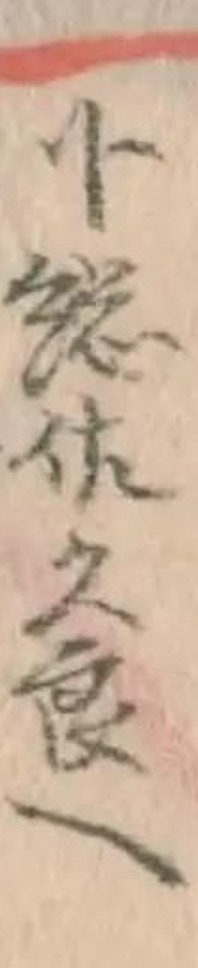下総佐久良へ
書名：四神地名録 6巻. [4]葛飾郡
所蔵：国立国会図書館 National Diet Library, JAPAN
